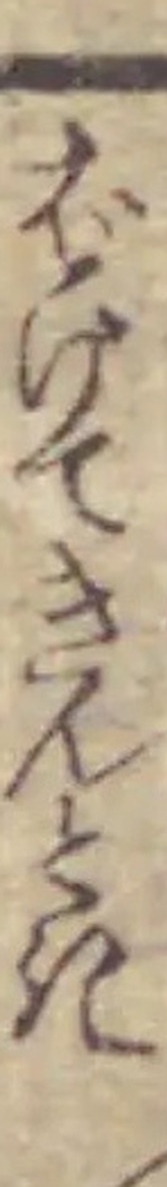ばけてきんとき
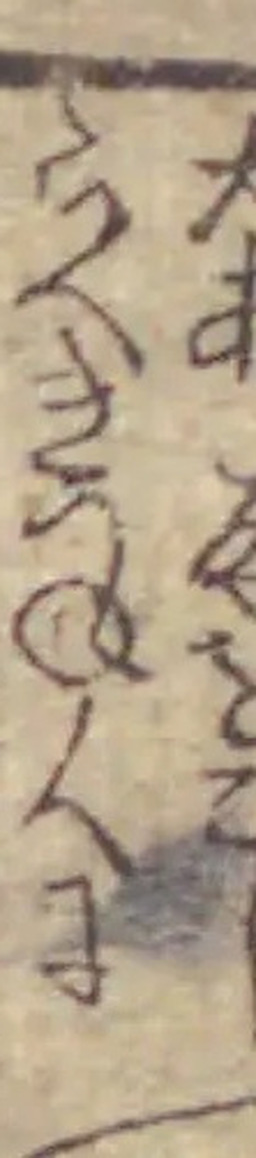らへきつね人に
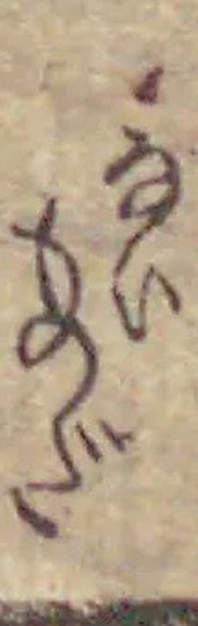ものだ
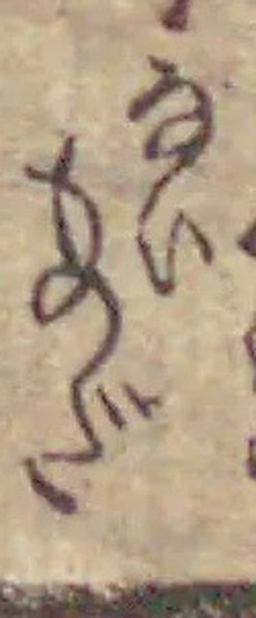ものだ
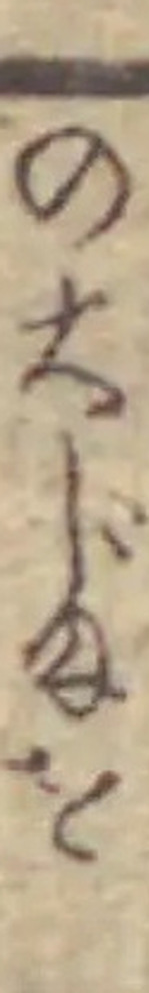の大じまを
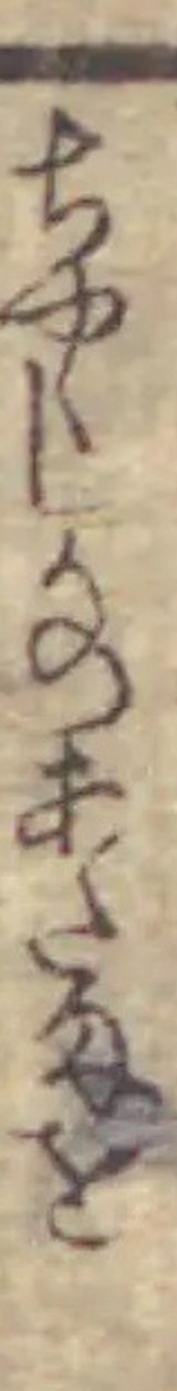ちやくしかのあたまを
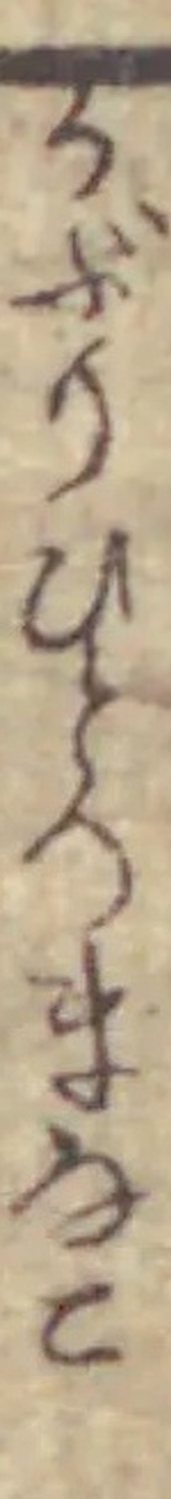かぶりひとつまなこ
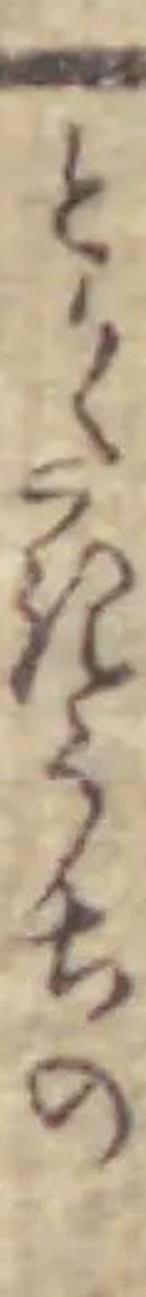とかたきうちの
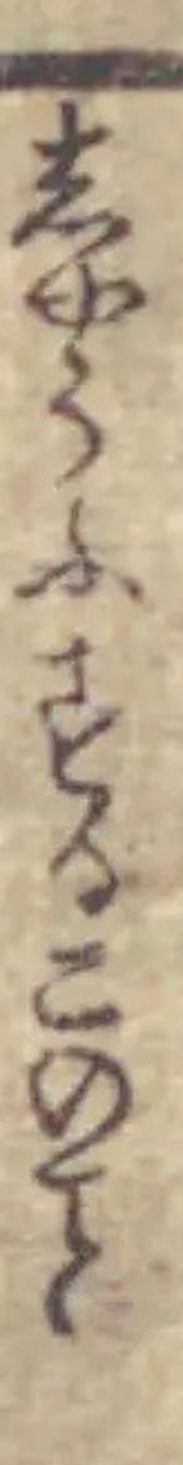しやうふするこのこと
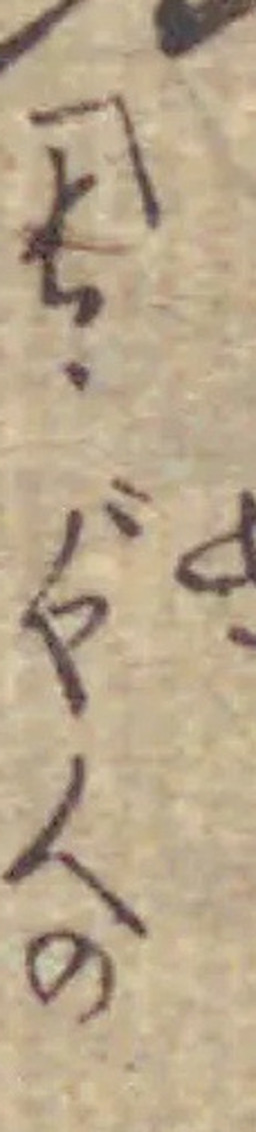〽はゝじヤ人の
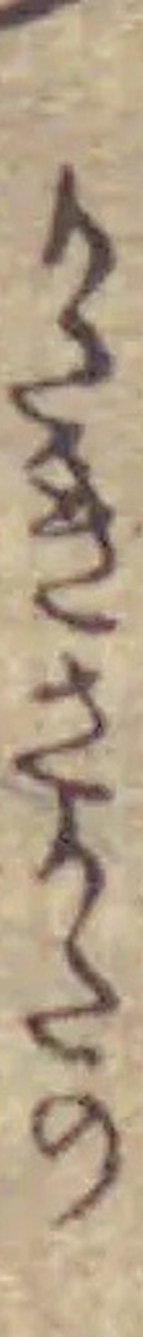かたきさかたの
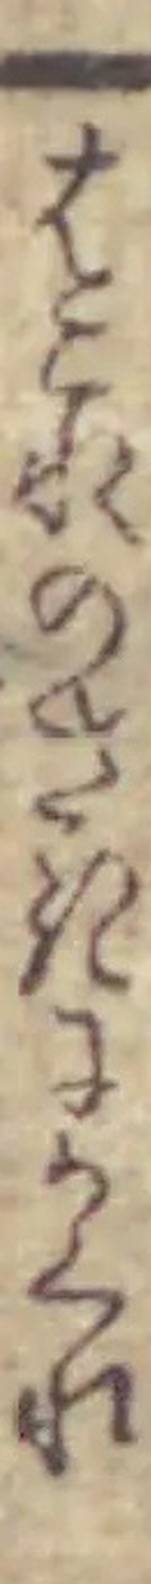はこねのさきにかくれ
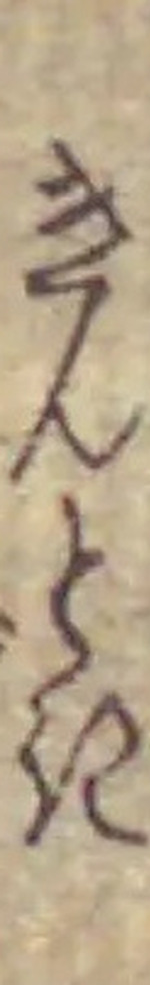きんとき
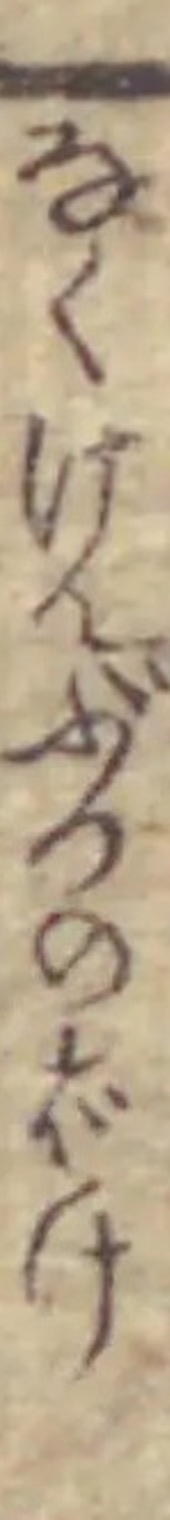なくけんぶつのばけ
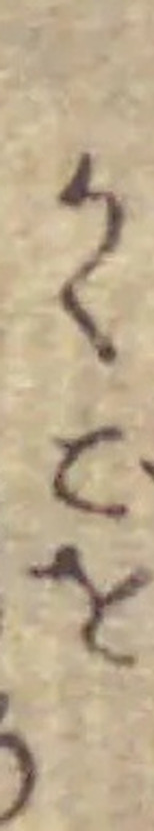かくごを
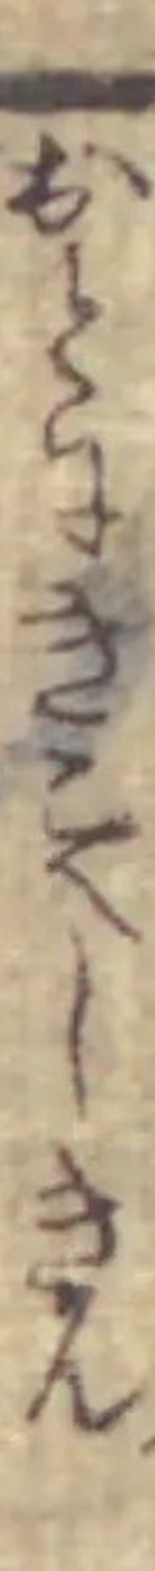おとにきこへしきん
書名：化物敵討 2巻
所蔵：国立国会図書館 National Diet Library, JAPAN
